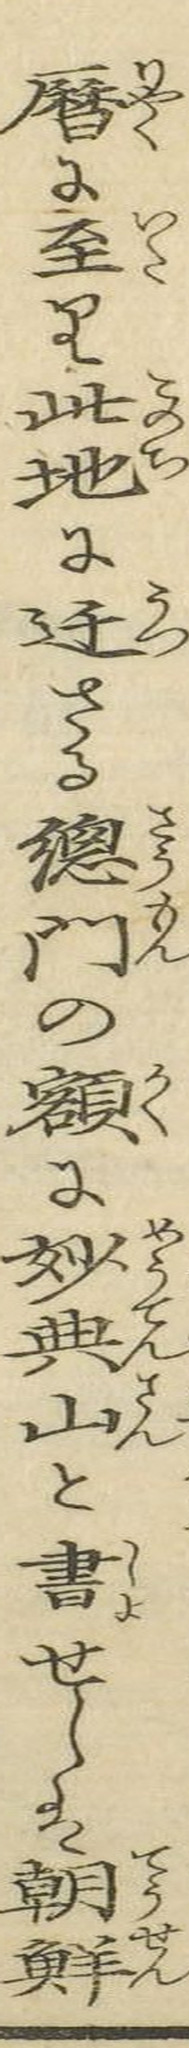歷に至り此地に迁さる總門の額に妙典山と書せしは朝鮮
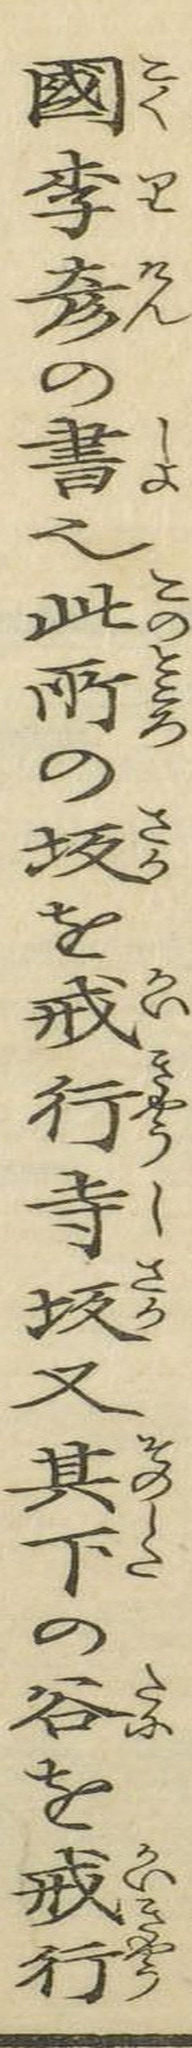國李彥の書也此所の坂を戒行寺坂又其下の谷を戒行
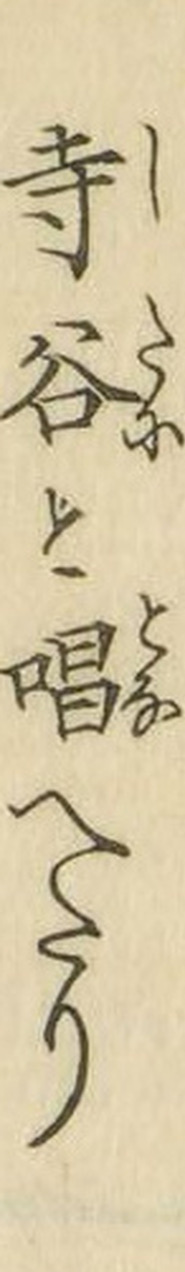寺谷と唱へたり
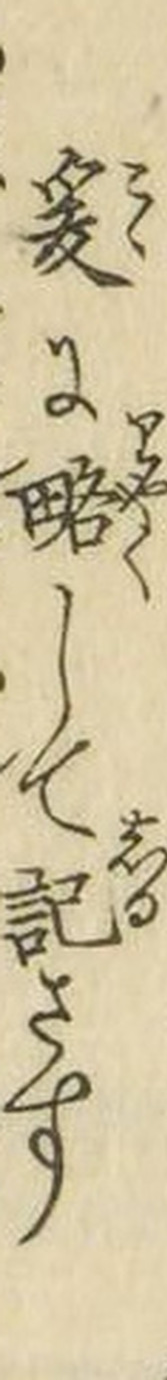爰に略して記さす
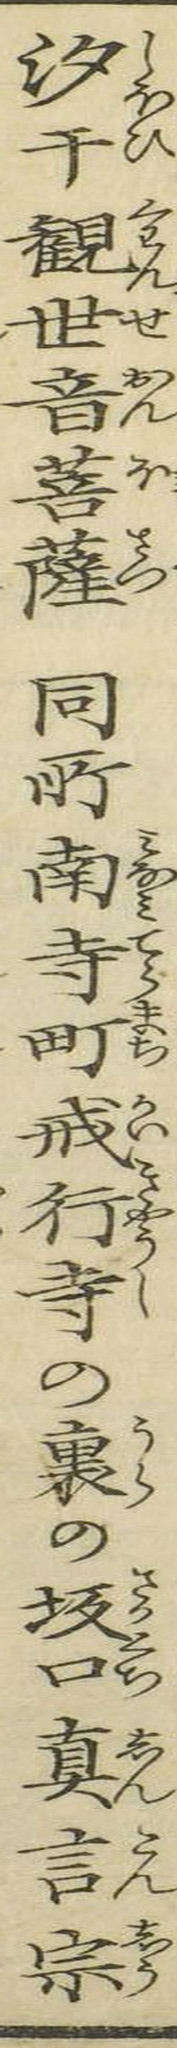汐干観世音菩薩同所南寺町戒行寺の裏の坂口真言宗
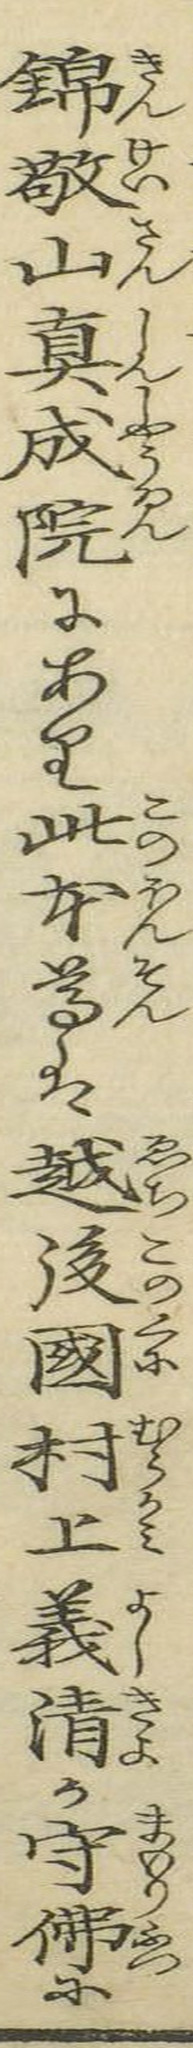錦敬山真成院にあり此本尊は越後國村上義清か守佛に
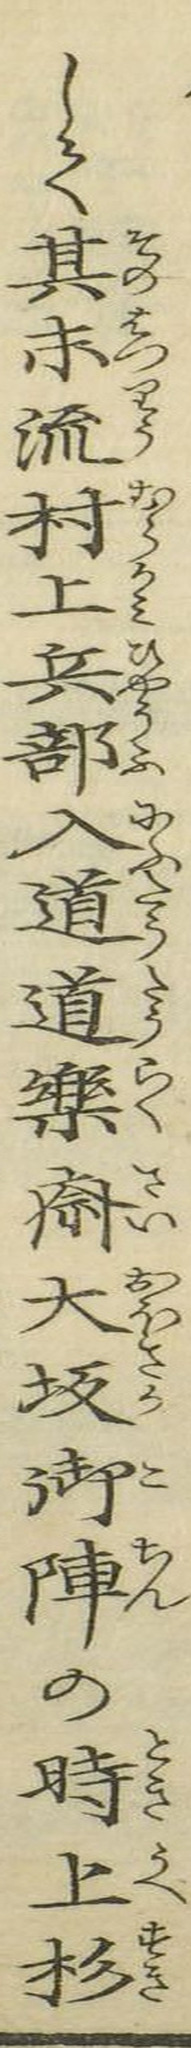して其末流村上兵部入道道樂斎大坂御陣の時上杉
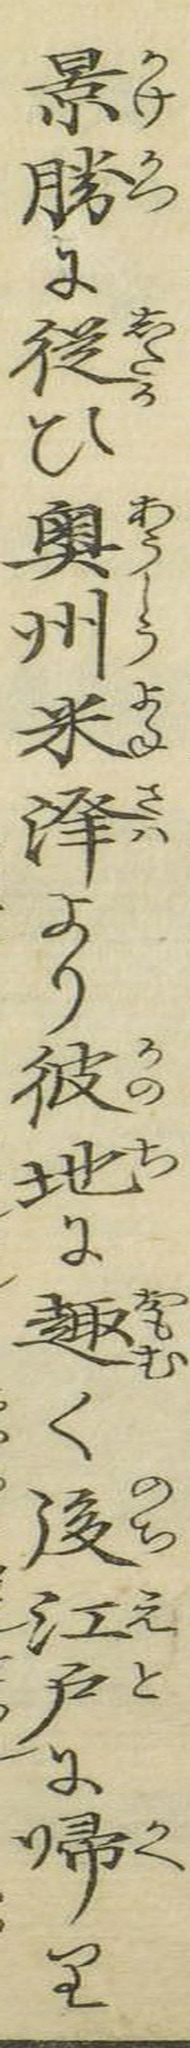景勝に従ひ奥州米泽より彼地に趣く後江戸に帰り
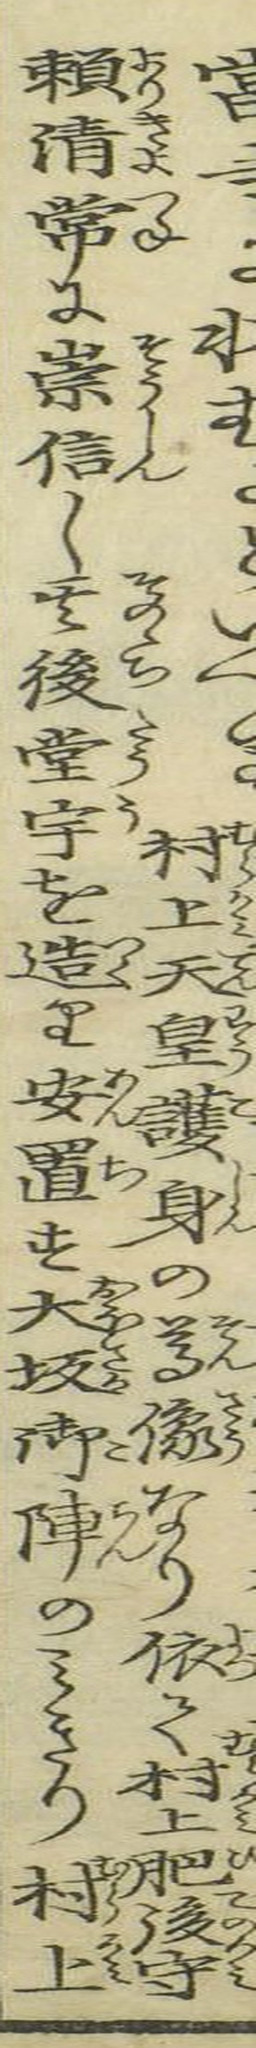頼清常に崇信し其後堂宇を造り安置す大坂御陣のみきり村上

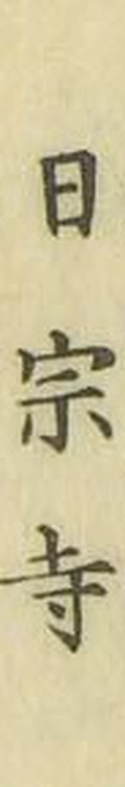日宗寺
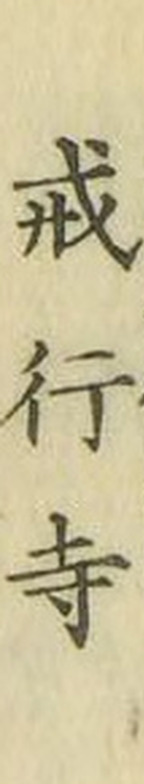戒行寺
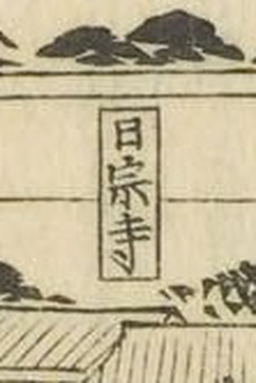日宗寺
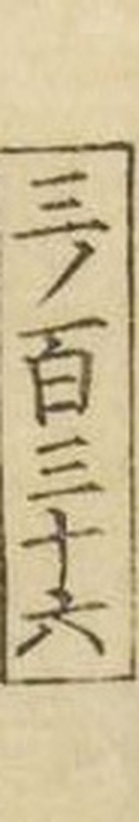三ノ百三十六

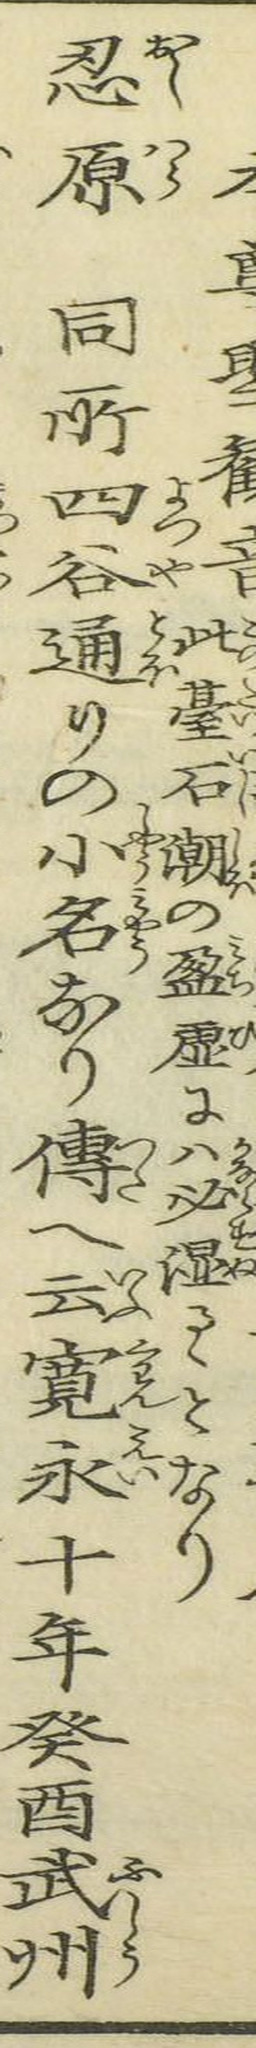忍原同所四谷通りの小名なり傳へ云寛永十年癸酉武州
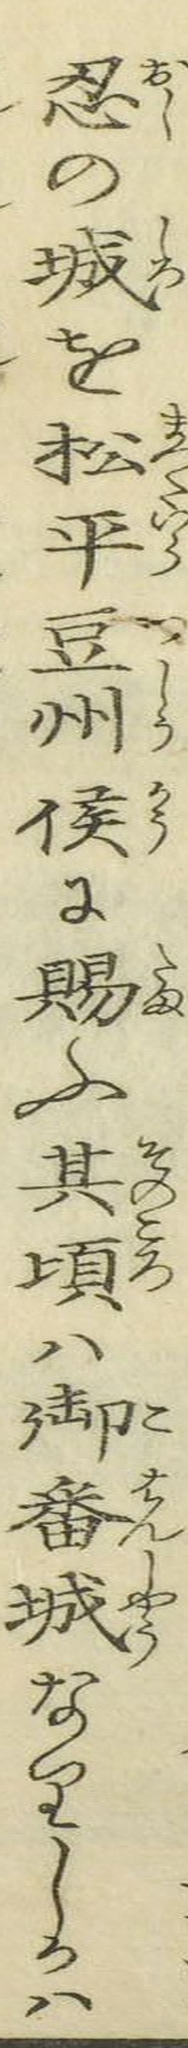忍の城を松平豆州侯に賜ふ其頃は御番城なりしかは
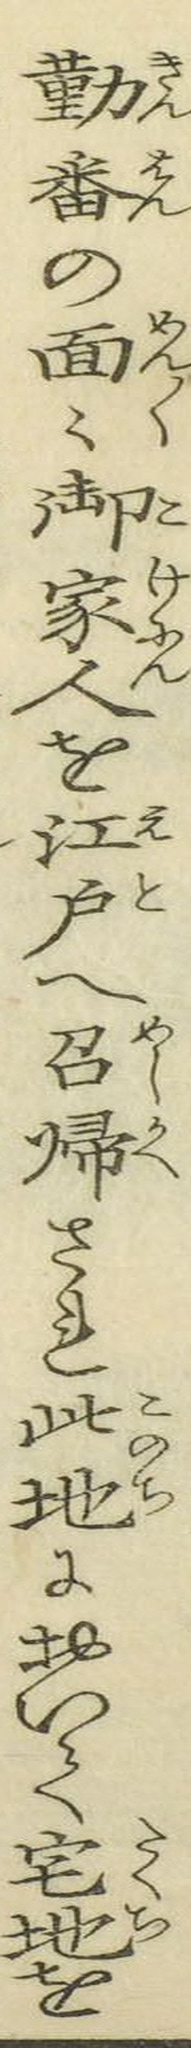勤番の面々御家人を江戸へ召帰され此地において宅地を
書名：江戸名所図会 20巻 巻之9
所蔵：東京学芸大学教育コンテンツアーカイブ
